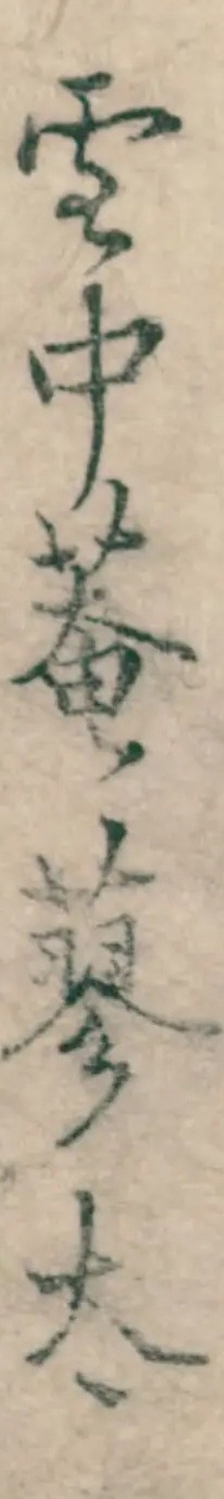雪中菴蓼太

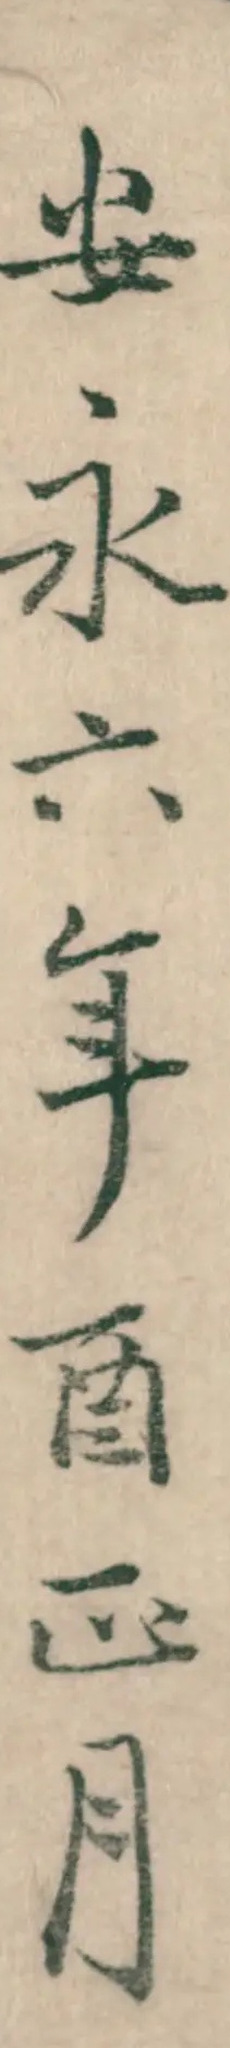安永六年酉正月
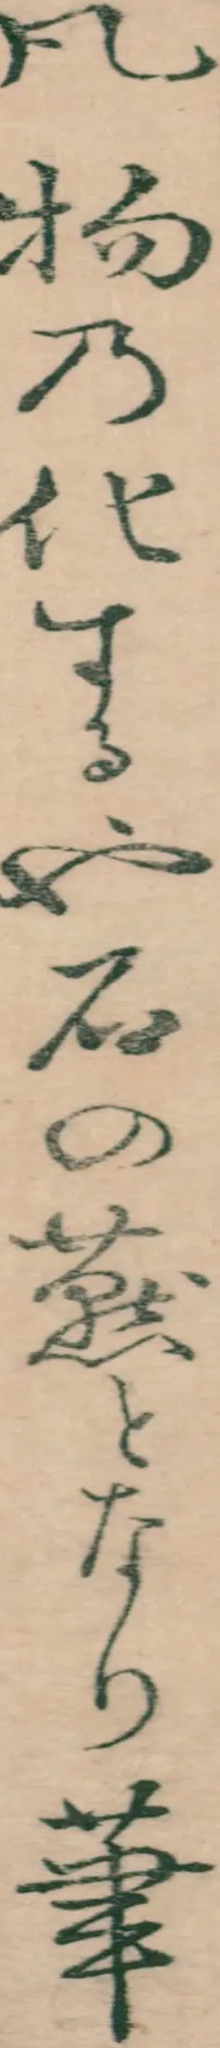凡物の化するや石の燕となり筆
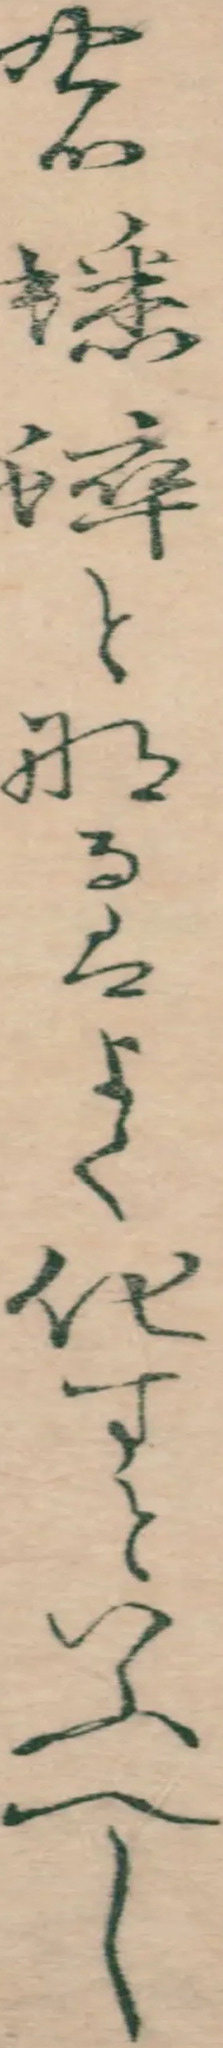の蟋蟀となるはよく化すといふへし
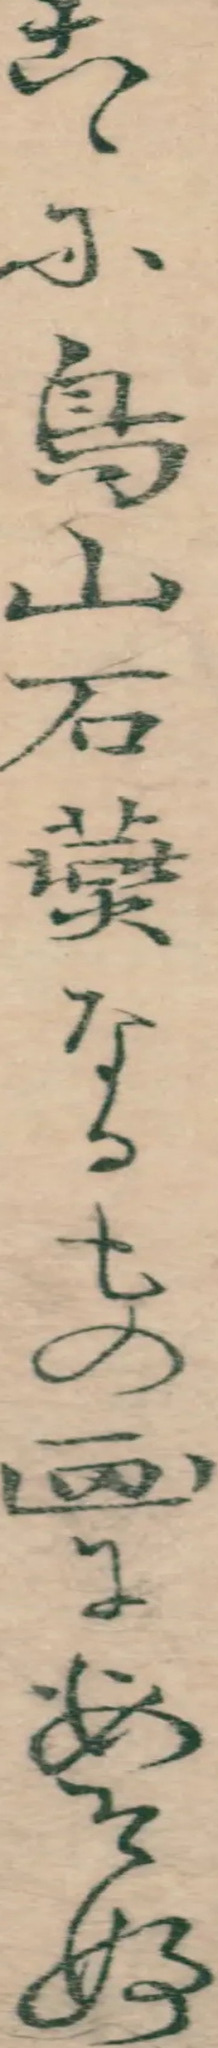こゝに鳥山石燕なるもの画にあそふ
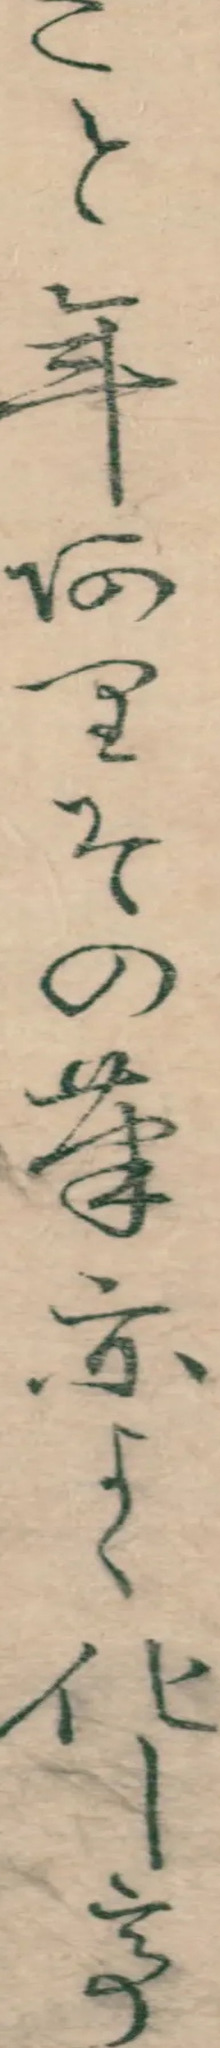こと年ありその筆亦よく化して
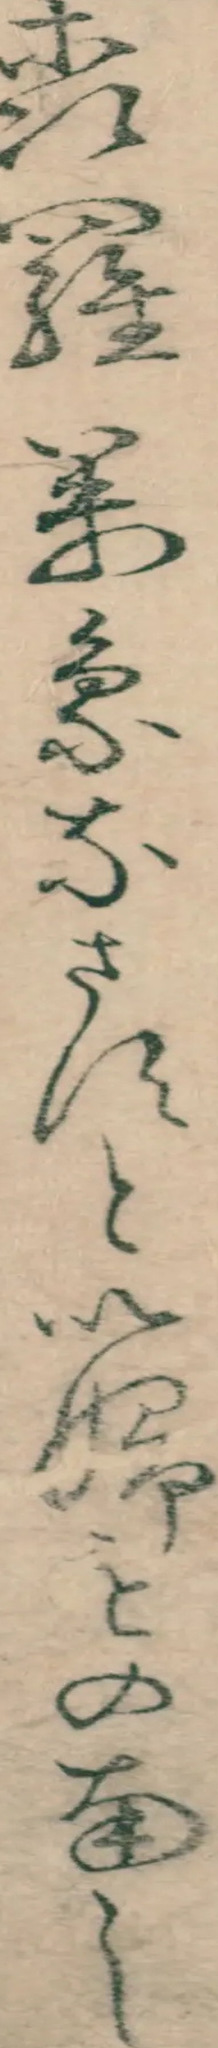森羅万象なさすといふものなし
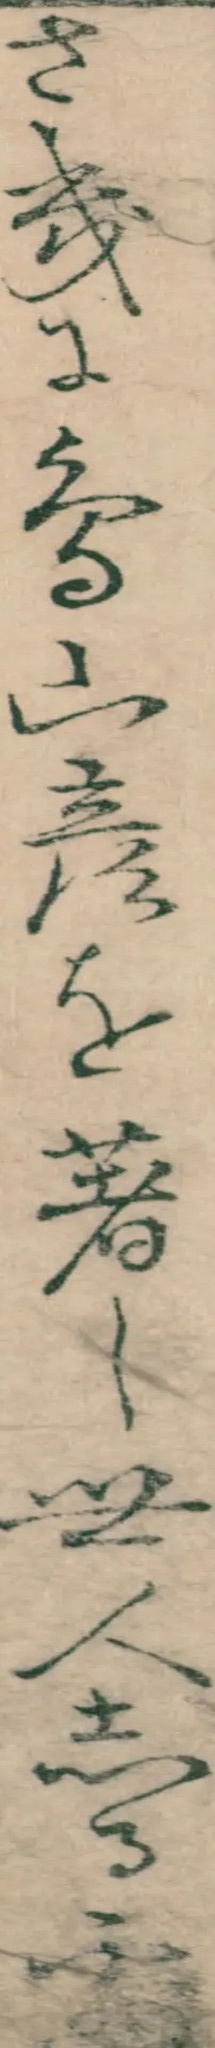さきに鳥山彦を著し世人しる処
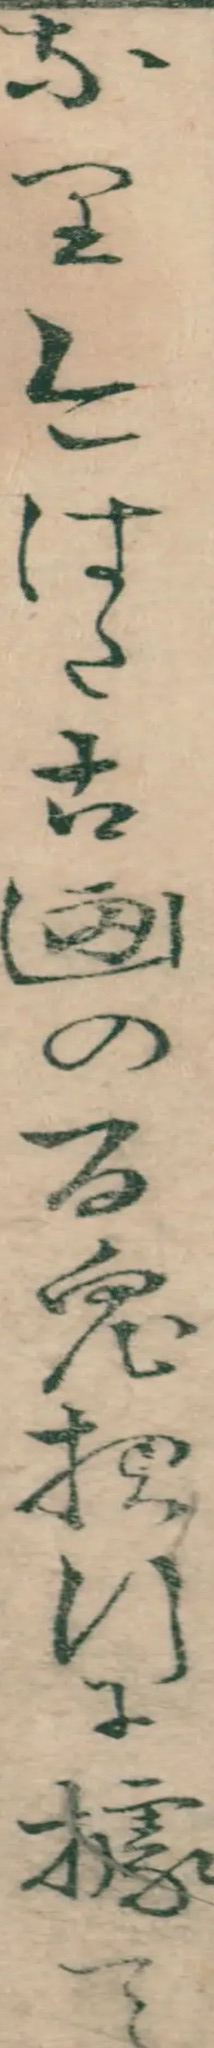なり今はた古画の百鬼夜行に據て

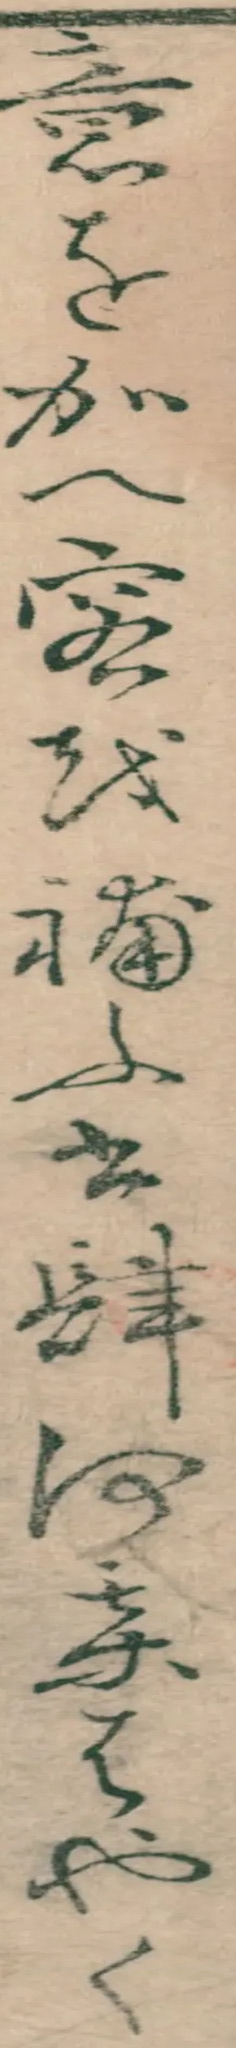意を加へ容を補ふ書肆何某はやく
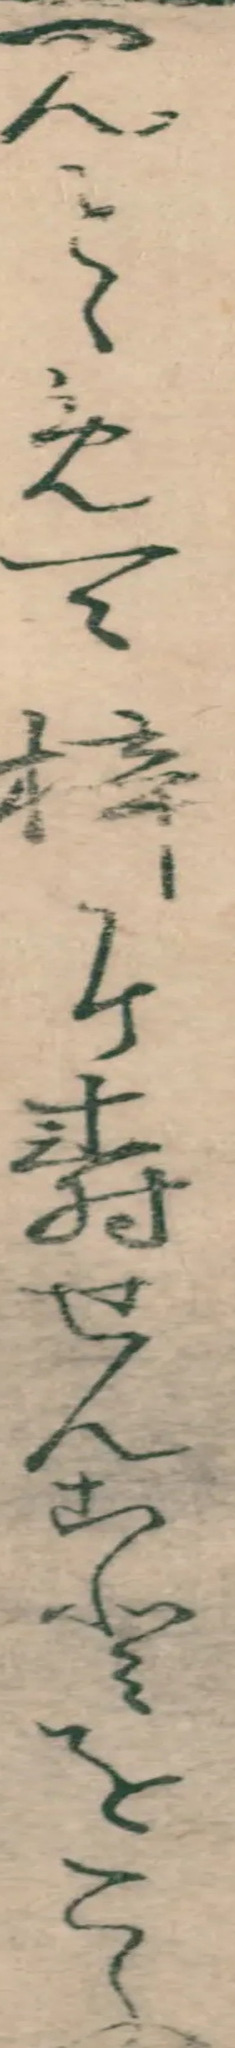見とゝめて梓に寿せんことをこふ
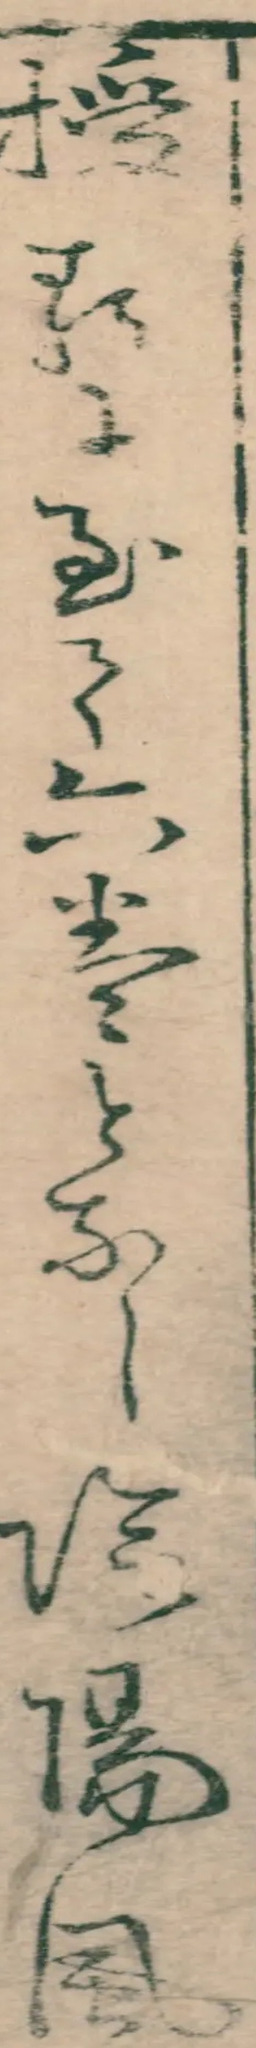授るに到て六巻となし陰陽風
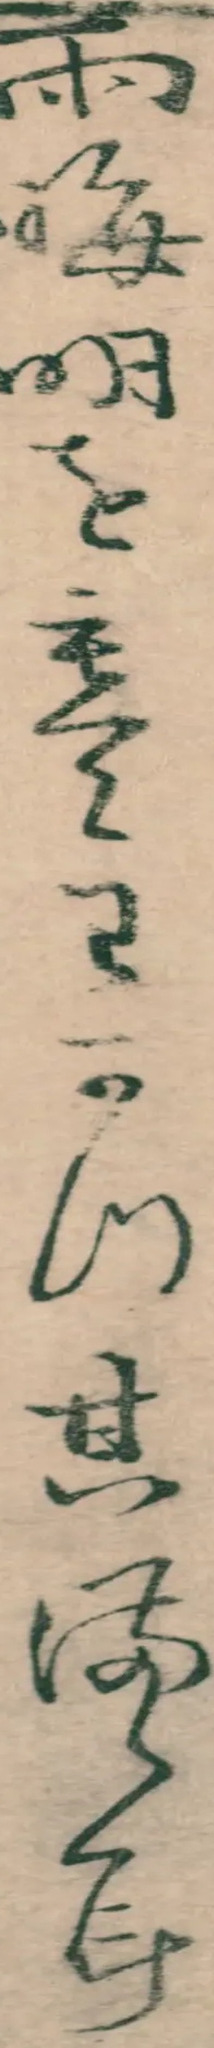雨晦明をもてわかつ其まゝに
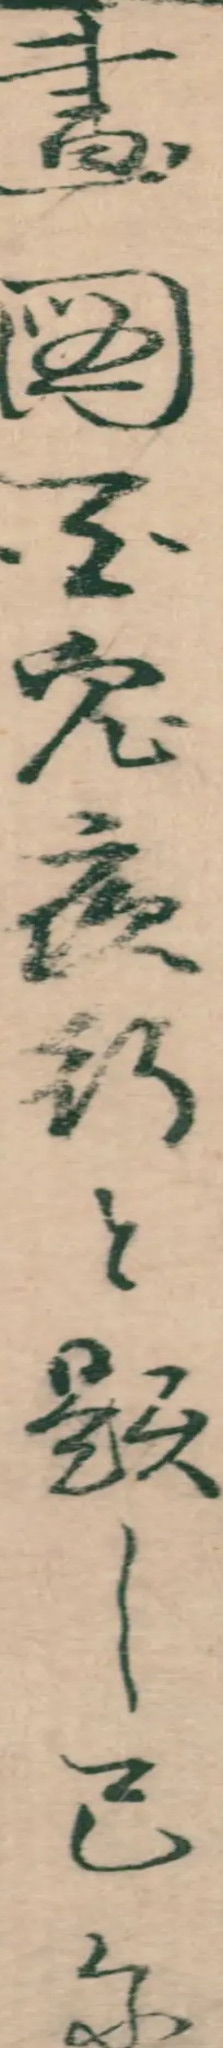画図百鬼夜行と題し已に
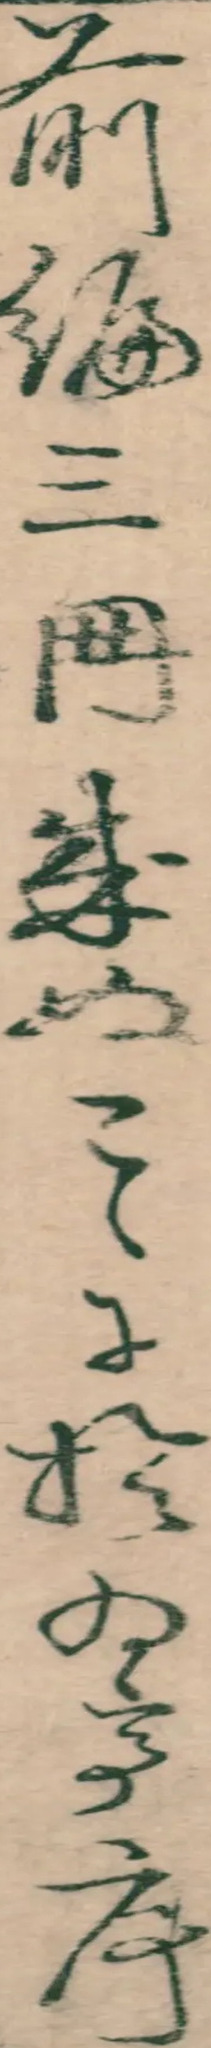前編三冊成ぬこゝにおゐて序
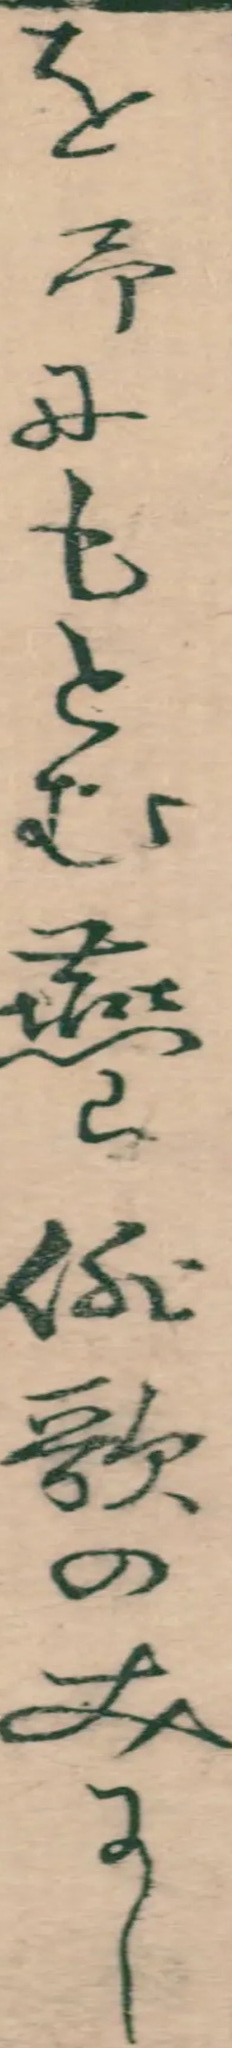を予にもとむ燕ら俳歌の友にし
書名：百鬼夜行 3巻拾遺3巻. [1]
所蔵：国立国会図書館 National Diet Library, JAPAN
